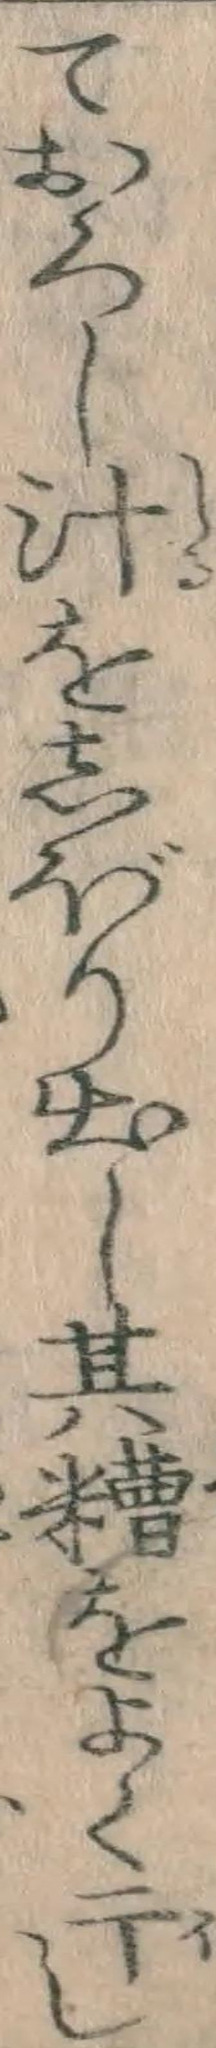ておろし汁をしぼり出し其糟をよく干し
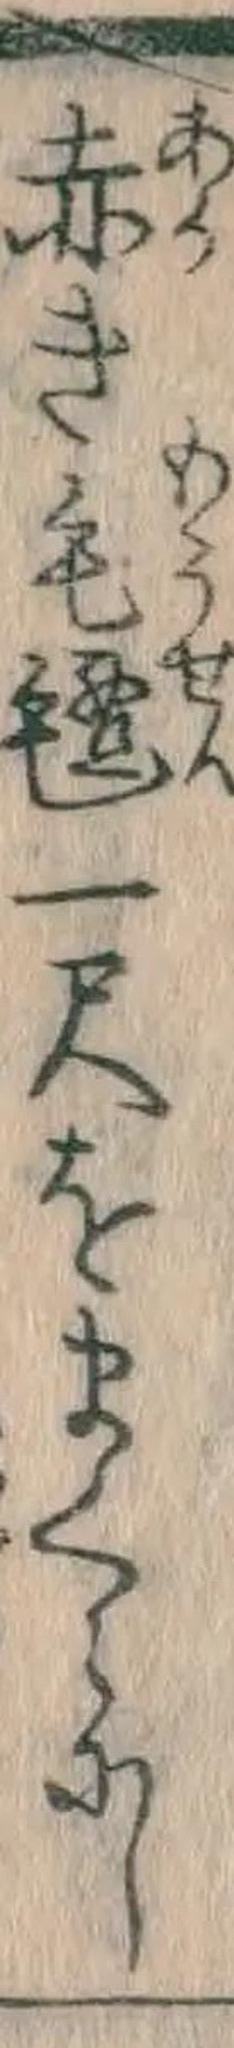赤き毛氈一尺をまくらにし
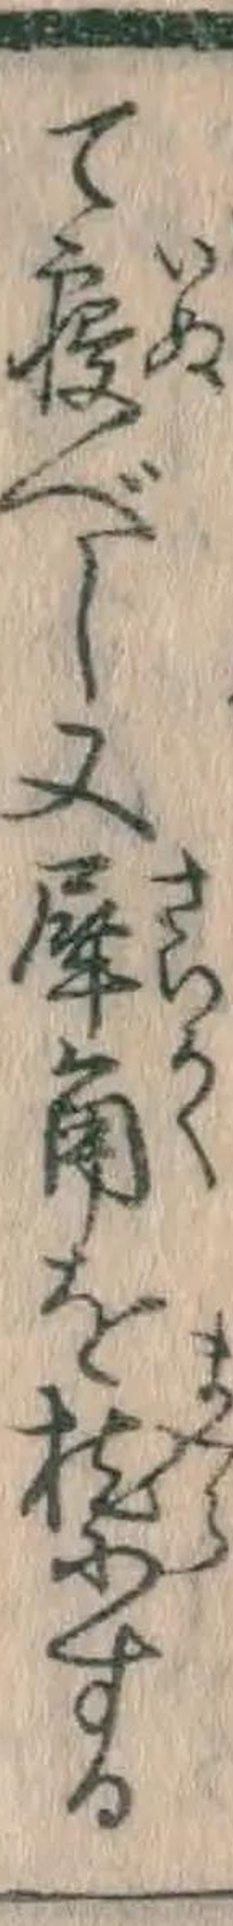て寝べし又犀角を枕にする
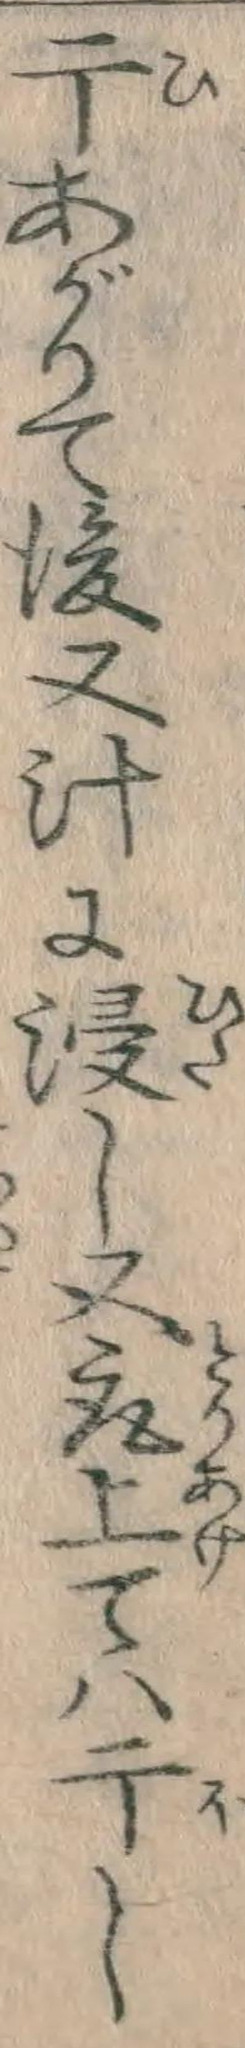干あがりて後又汁に浸し又取上ては干し
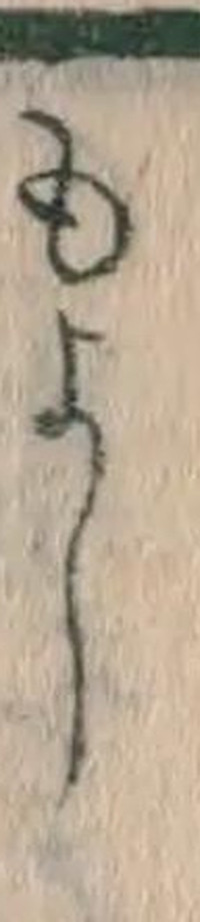もよし
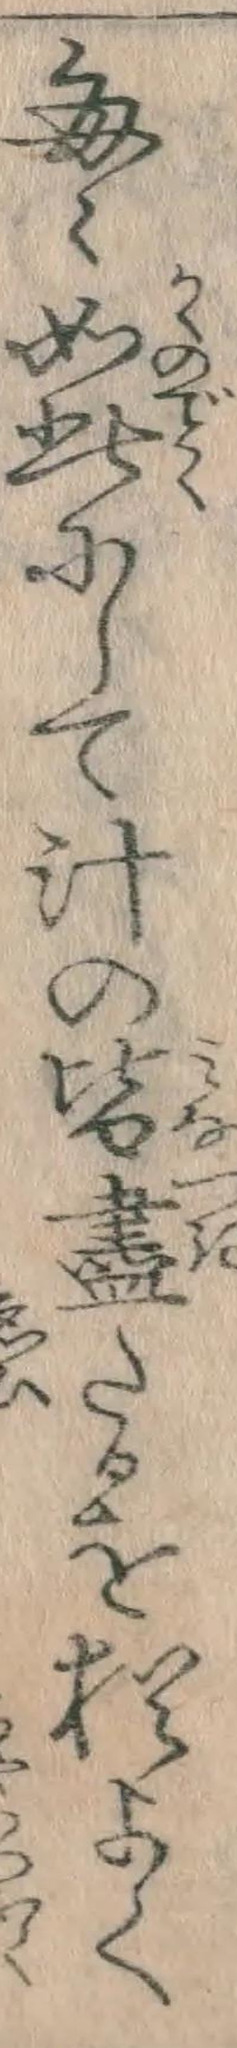毎々如此にして汁の皆尽たるを猶よく
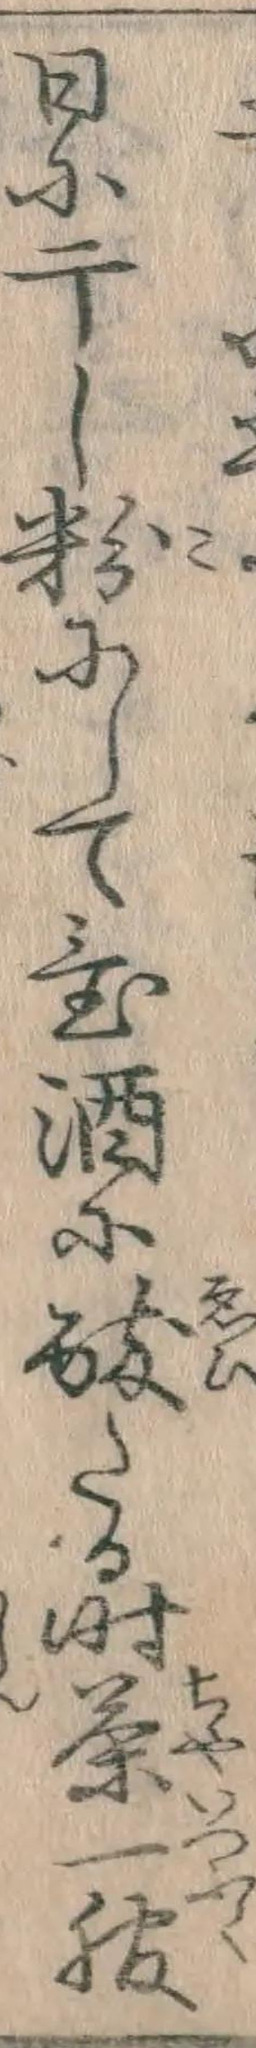日に干し粉にして置酒に酔たる時茶一服
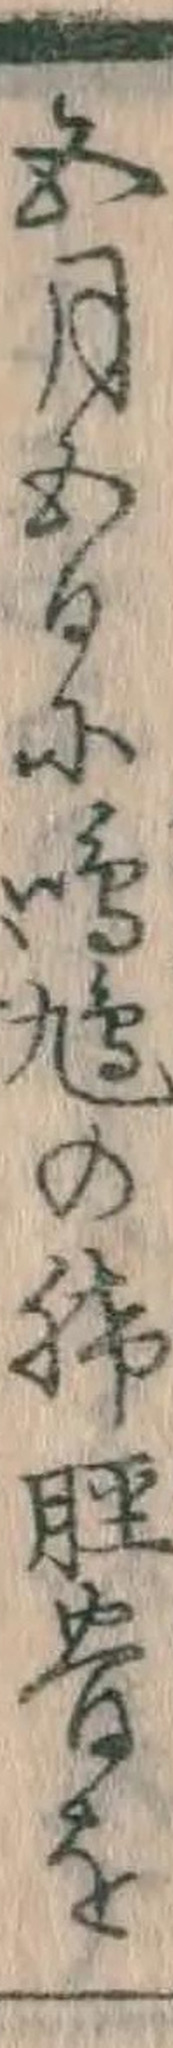五月五日に鳴鳩の脚脞骨を
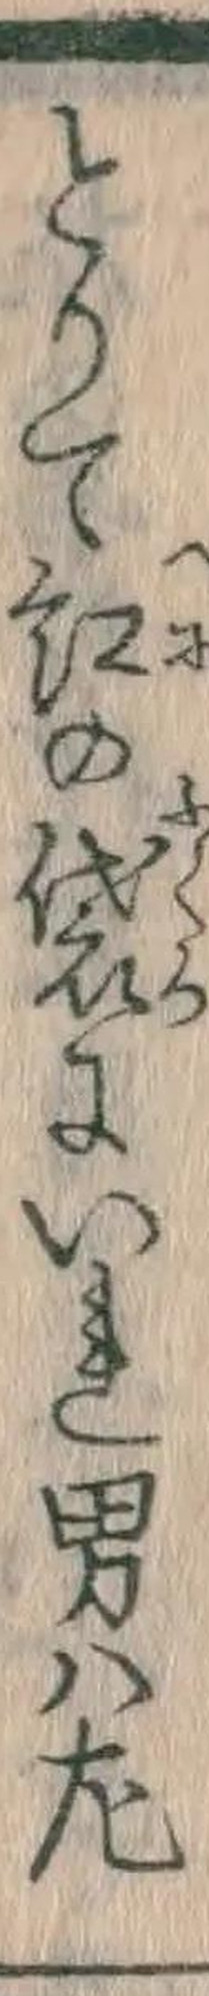とりて紅の袋にいれ男は左
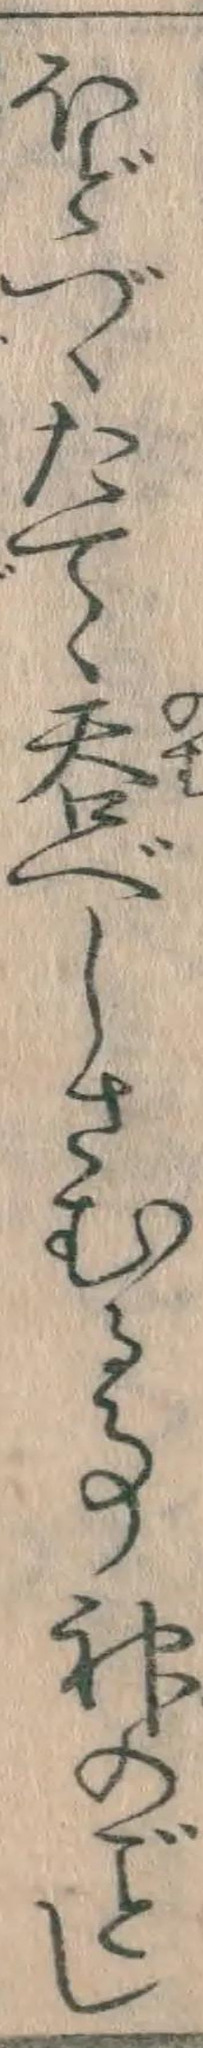ほどづゝたてゝ呑べしさむる事神のごとし
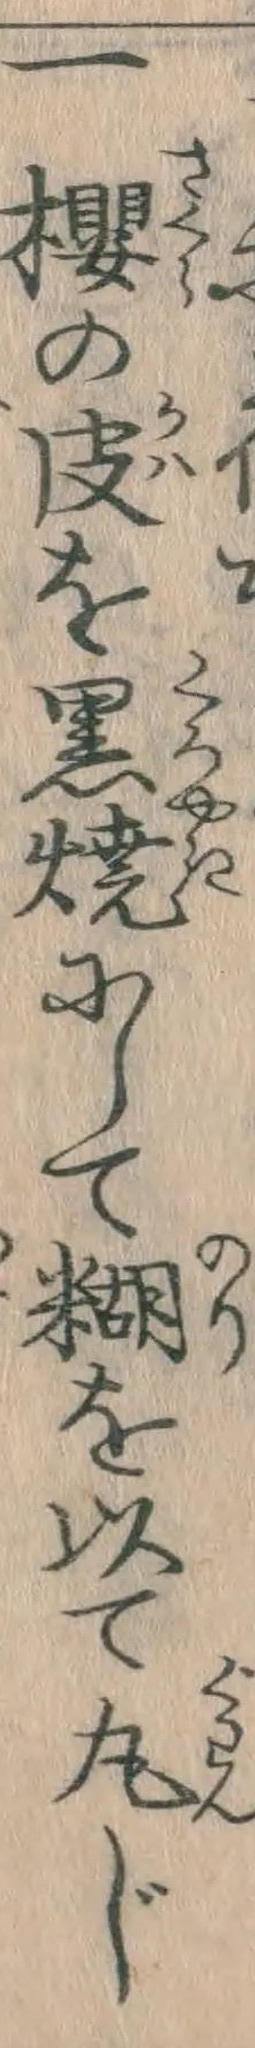一桜の皮を黒焼にして糊を以て丸じ
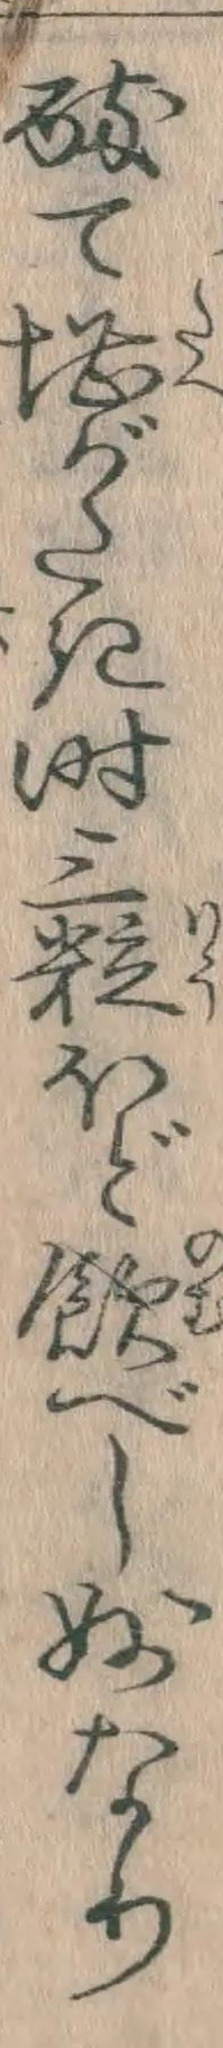酔て堪がたき時三粒ほど飲べし妙なり
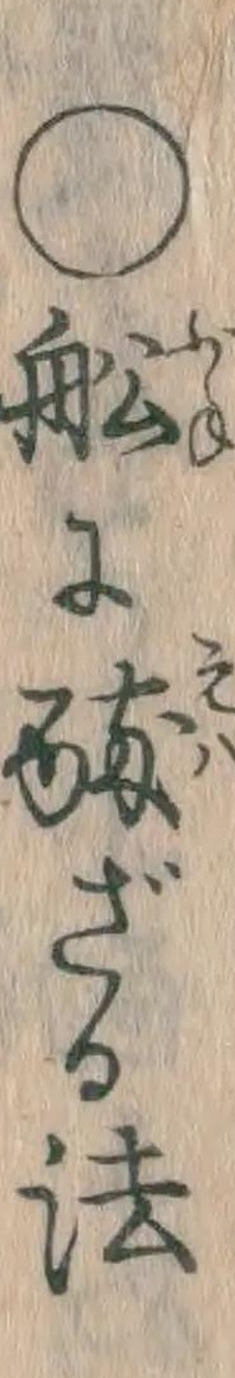○船に酔ざる法
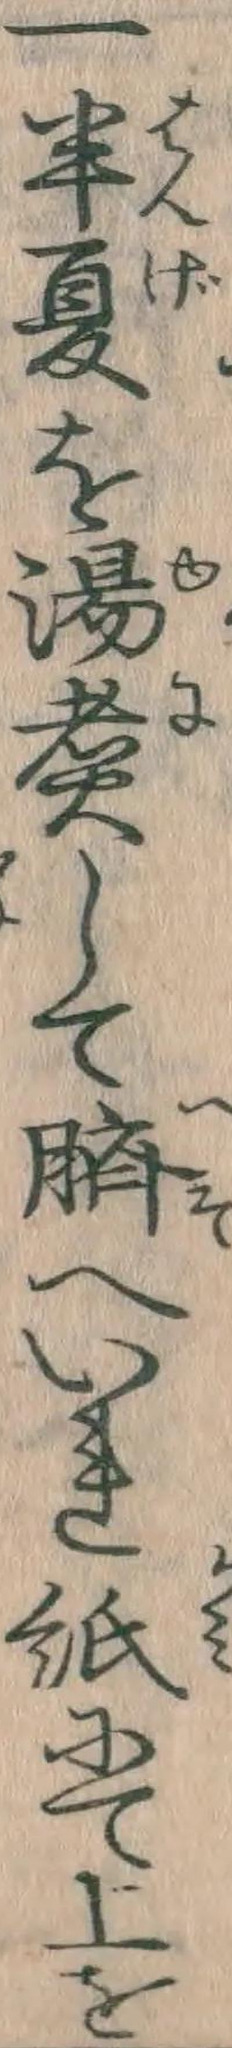一半夏を湯煮して臍へいれ紙にて上を
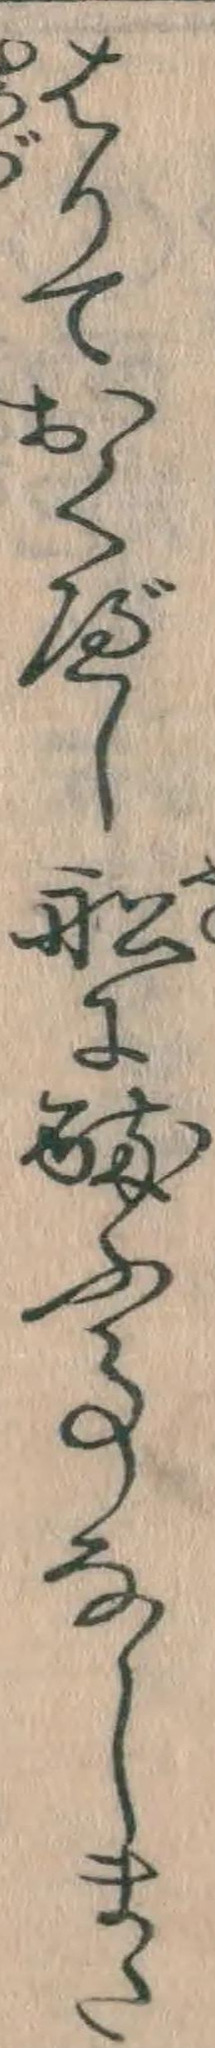はりておくべし船に酔ふ事なしまた
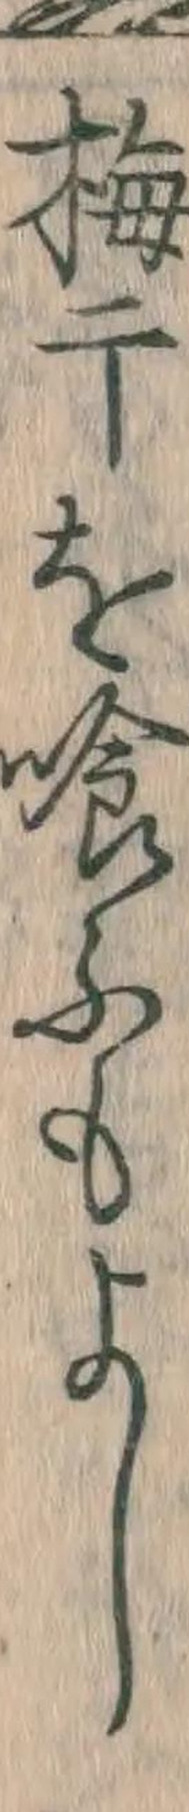梅干を喰ふもよし
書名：広益秘事大全 3巻. [4]
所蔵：国立国会図書館 National Diet Library, JAPAN
